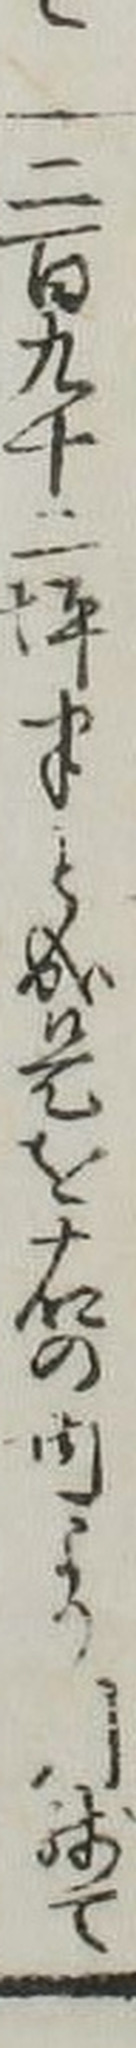二百九十二坪半と成是を右の内より残て
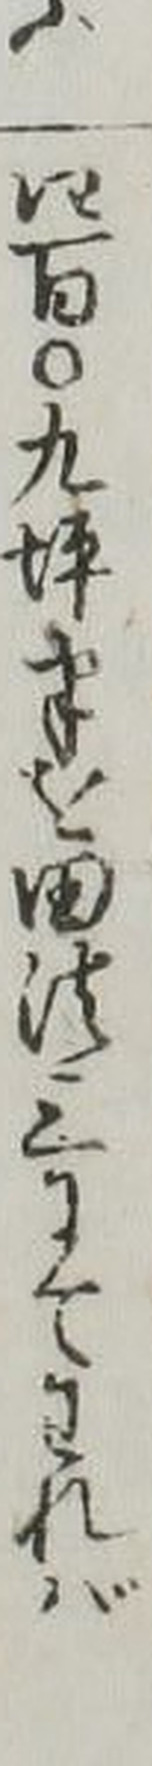四百〇九坪半を田法三にてわれば
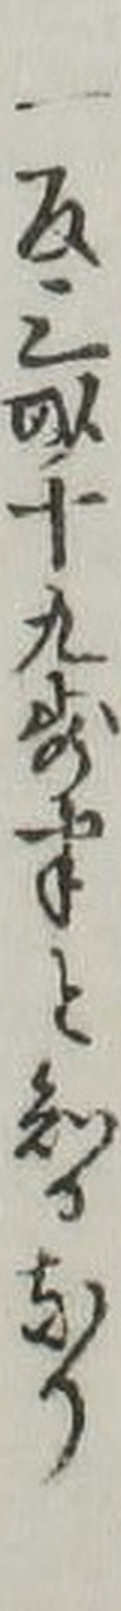一反三畝十九歩半と知るなり
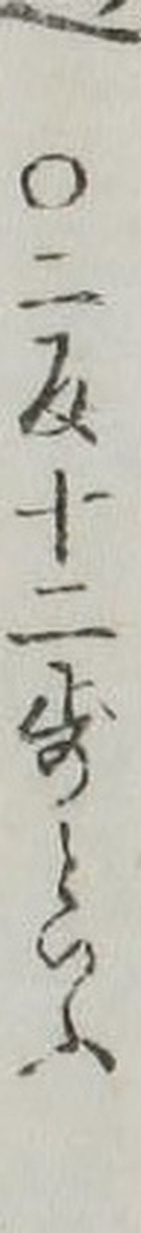○二反十二歩といふ
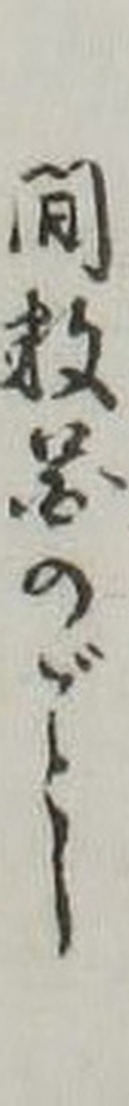間数図のごとし
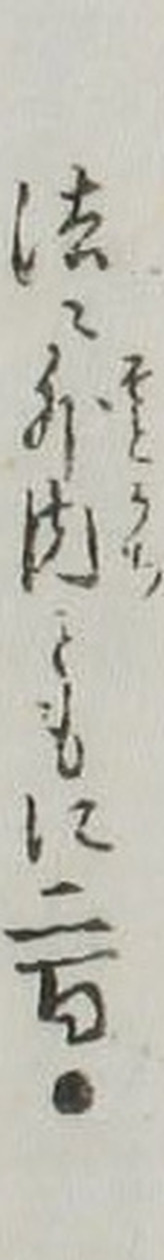法に外内ともに二百●
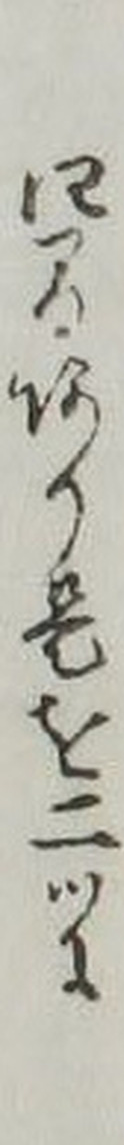四間あり是を二ツに
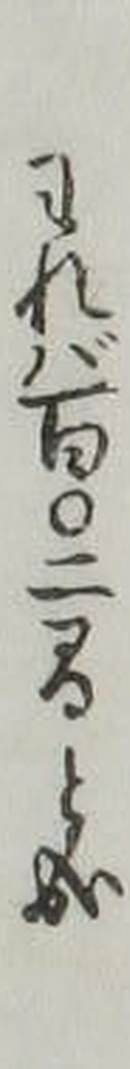われば百〇二間と成

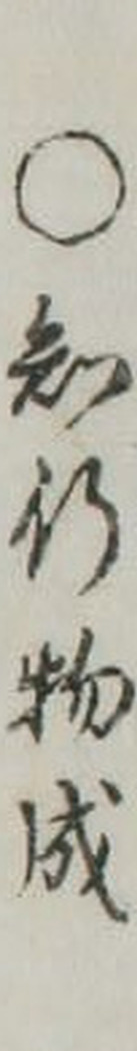○知行物成
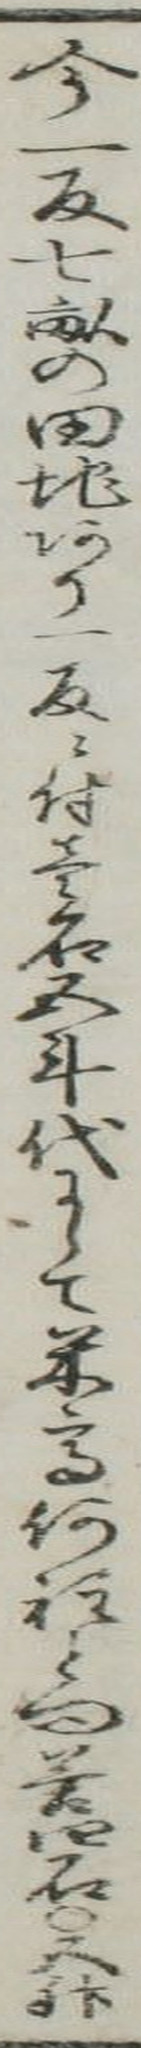今一反七畝の田地あり一反に付壱石五斗代にして米高何程と問答四石〇五升
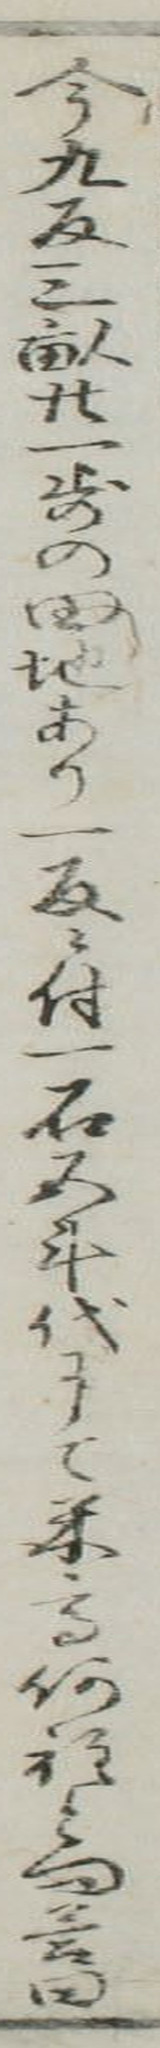今九反三畝廿一歩の田地あり一反に付一石五斗代にして米高何程と問答曰
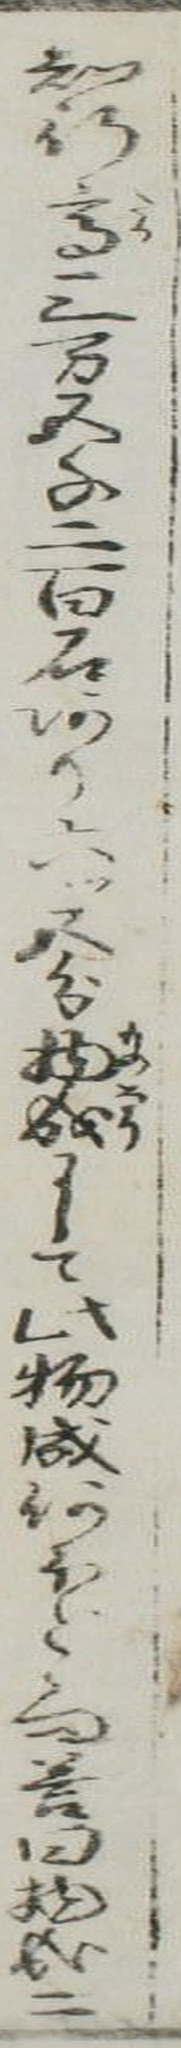知行高三万五千二百石あり六ツ五分物成にして此物成何ほどゝ問答曰物成二
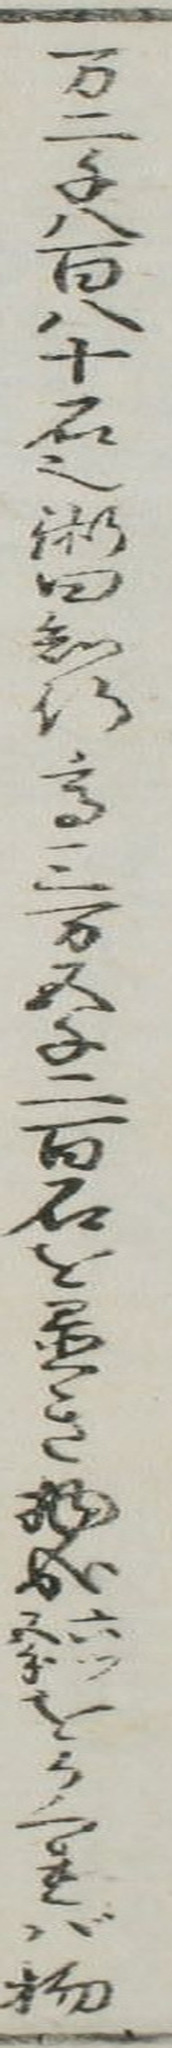万二千八百八十石也術曰知行高三万五千二百石を置き物成六ツ五分をかくれば物
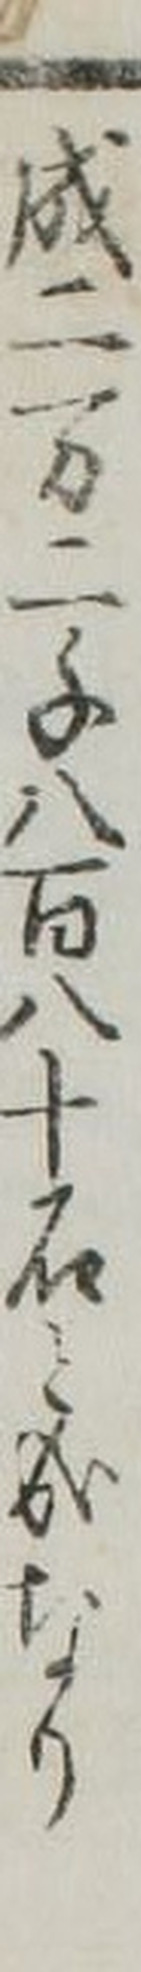成二万二千八百八十石と成なり
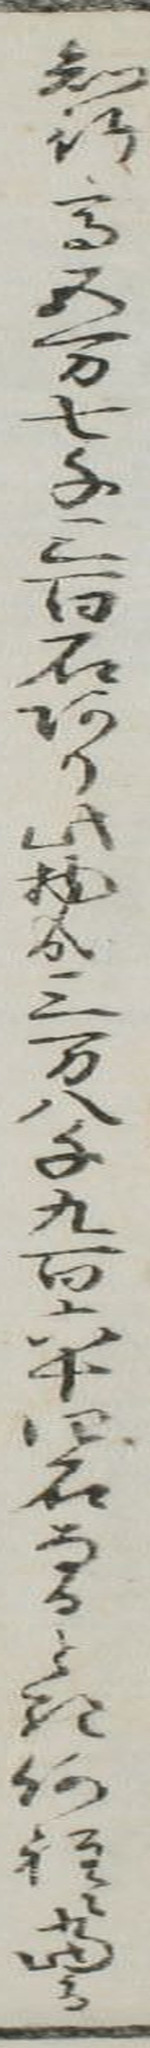知行高五万七千三百石あり此物成三万八千九百六十四石なるとき何程に当る
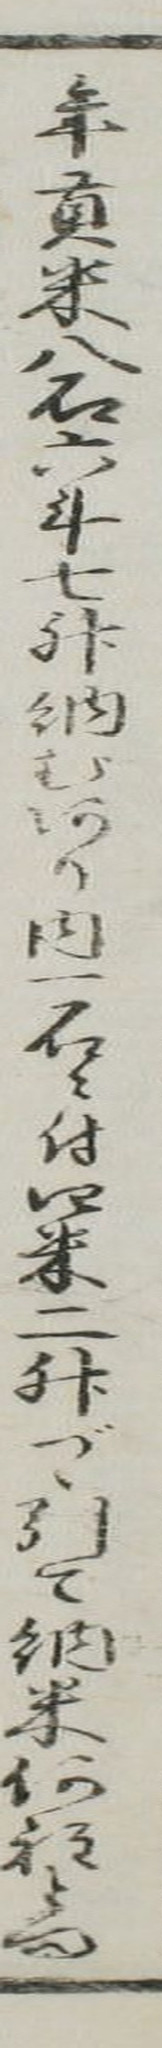年貢米八石六斗七升納むあり内一石に付口米二升づゝ引て納米何程と問
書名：宝玉塵劫記
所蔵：東京学芸大学教育コンテンツアーカイブ
